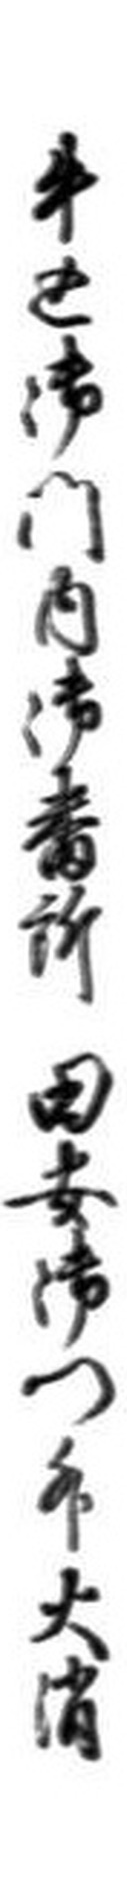牛込御門内御番所田安御門外火消
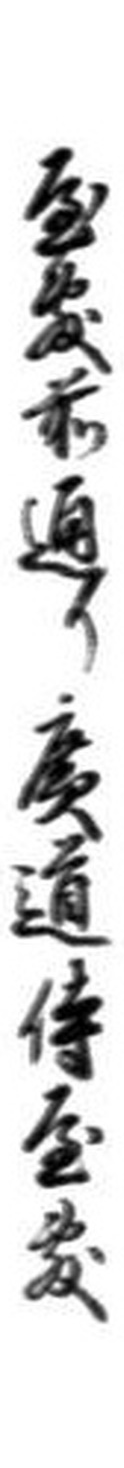屋敷前通り広道侍屋敷
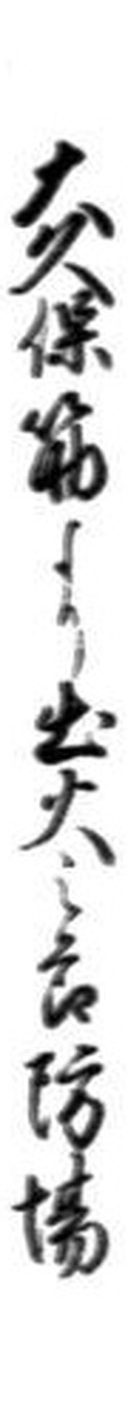大久保筋より出火之節防場
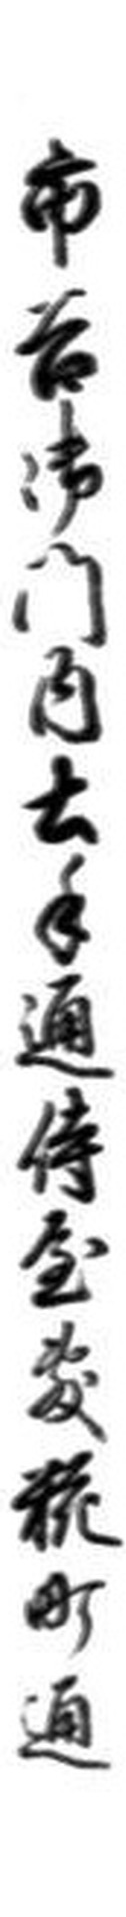市谷御門内土手通侍屋敷糀町通
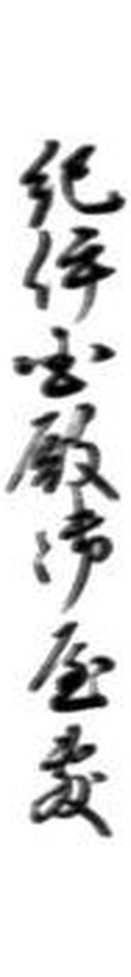紀伊国殿御屋敷
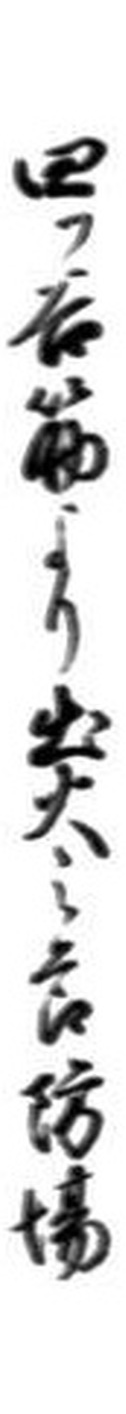四ツ谷筋より出火之節防場

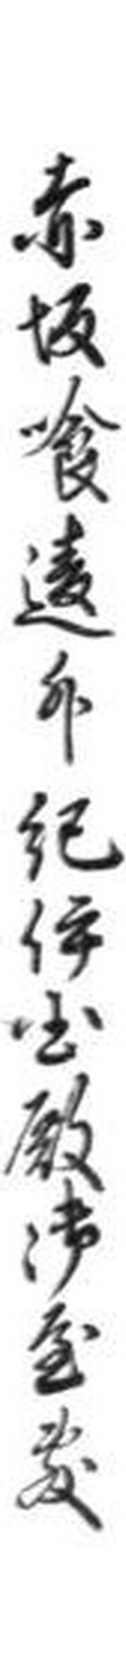赤坂喰違外紀伊国殿御屋敷
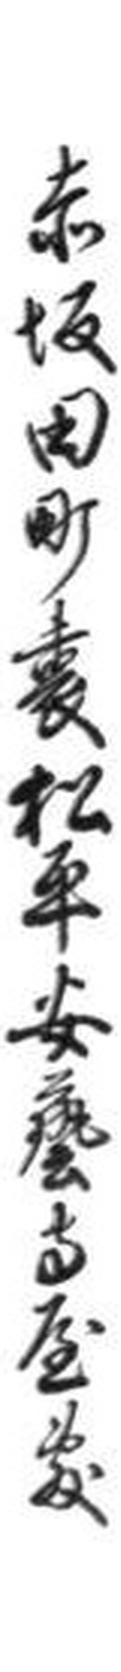赤坂田町裏松平安芸守屋敷
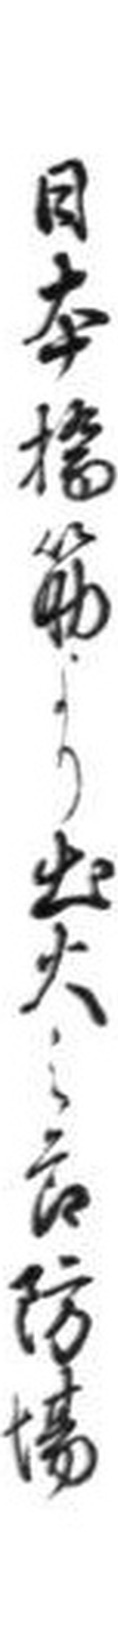日本橋筋より出火之節防場
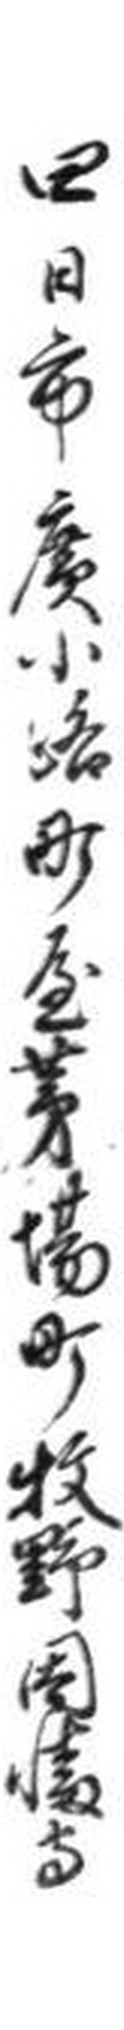四日市広小路町屋茅場町牧野因幡守
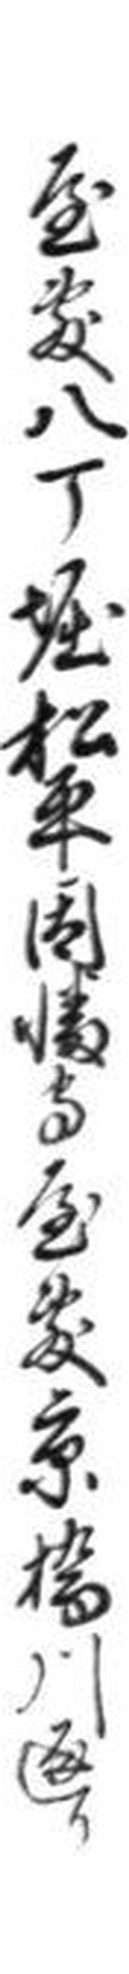屋敷八丁堀松平因幡守屋敷京橋川通り
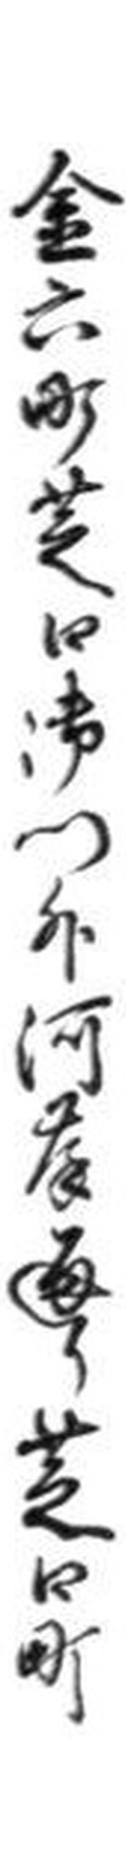金六町芝口御門外河岸通り芝口町
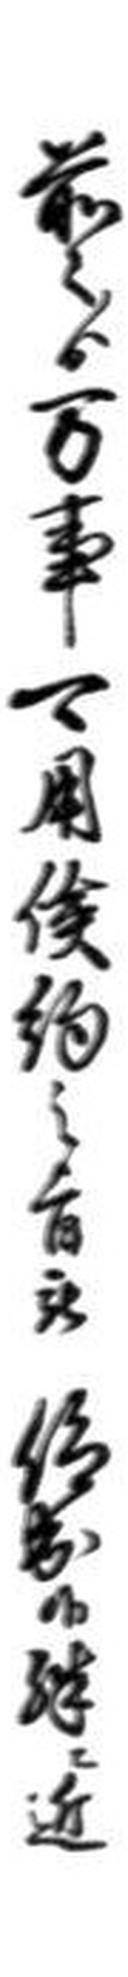前々ゟ万事可用倹約之旨被仰出候殊ニ近
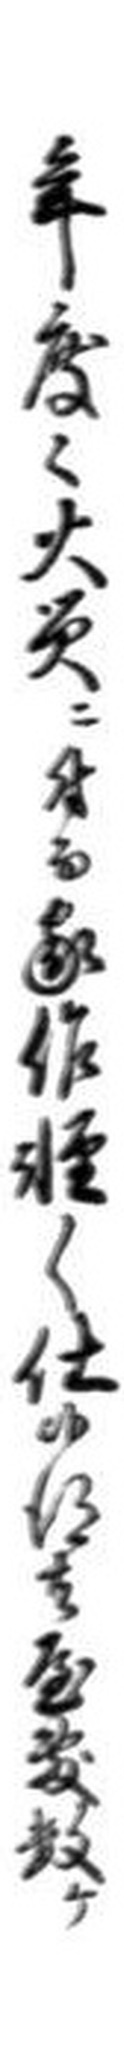年度々火災ニ付而家作軽く仕候得共屋敷数ケ
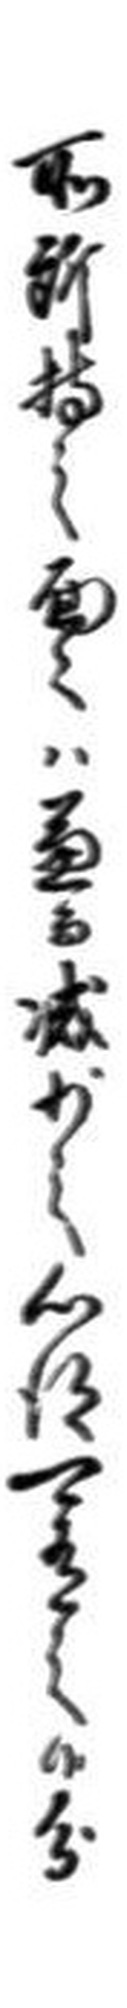所所持之面々ハ兼而減少之心得可有之候分
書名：家譜 三十二 吉邦公 従享保二年到享保三年
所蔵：福井県文書館 Fukui Prefectural Archives
